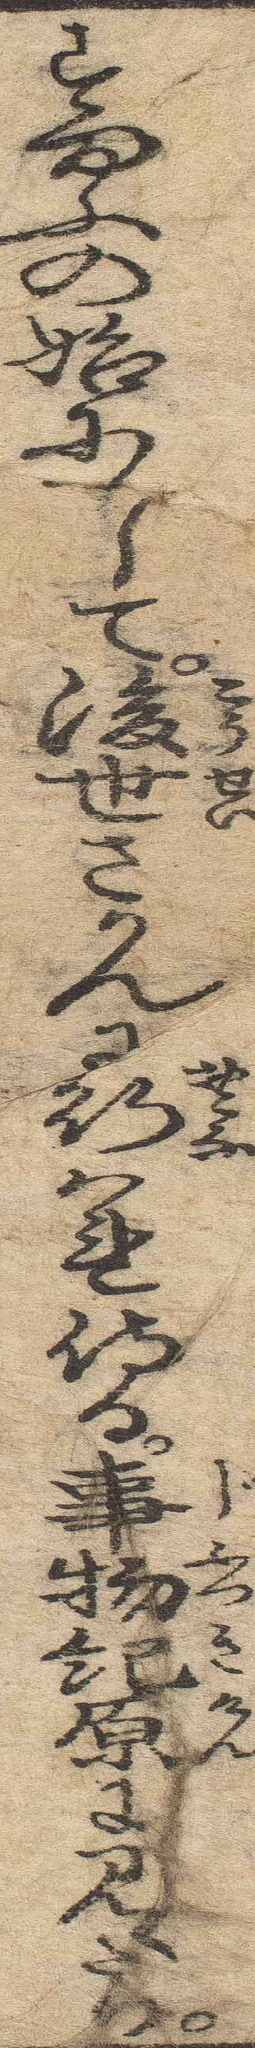すまふの始にして。後世さかんに行はれ侍る。事物紀原に見へたり。
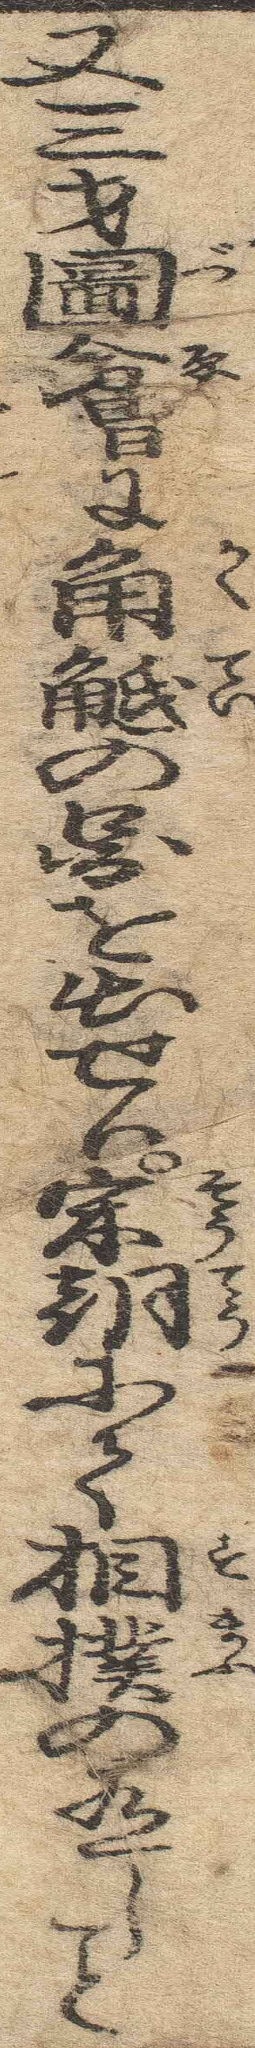又三才図会に角觝の図を出せり。宋朝にて相撲の有しこと
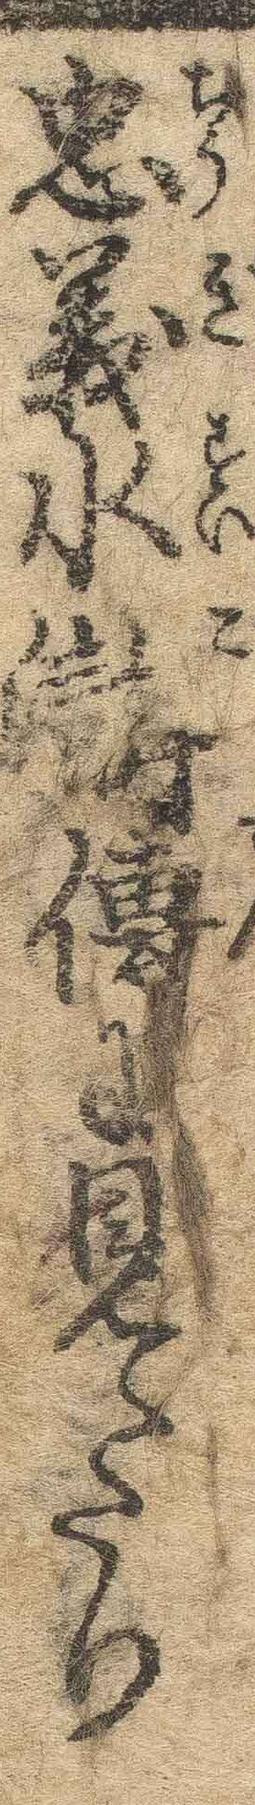忠義水滸伝に見へたり

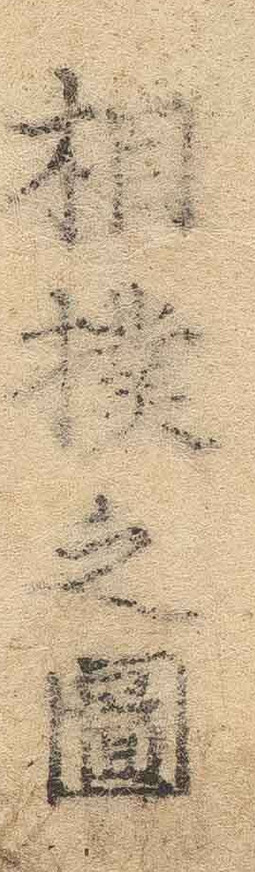相撲之図
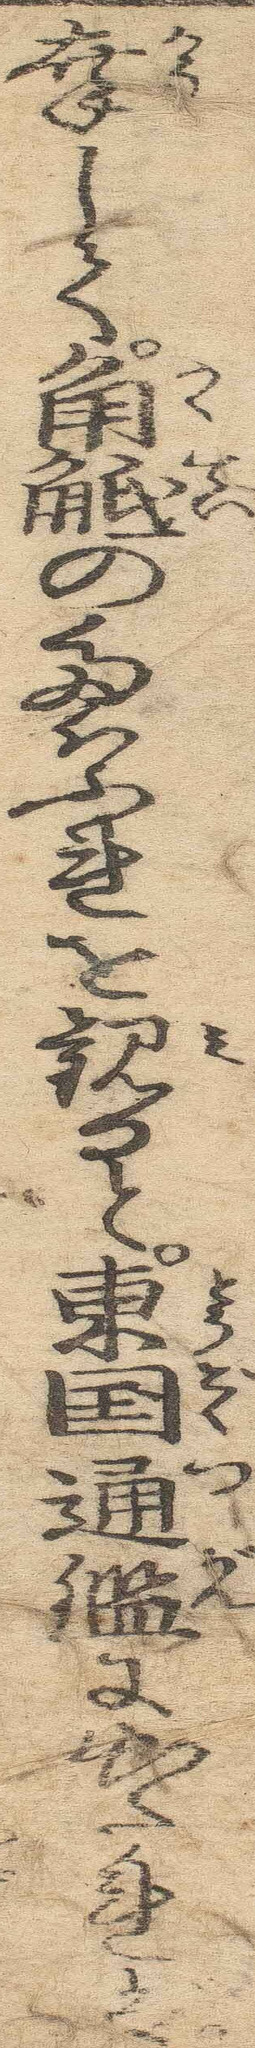幸して。角觝のたはふれを観ると。東国通鑑に出たれば。
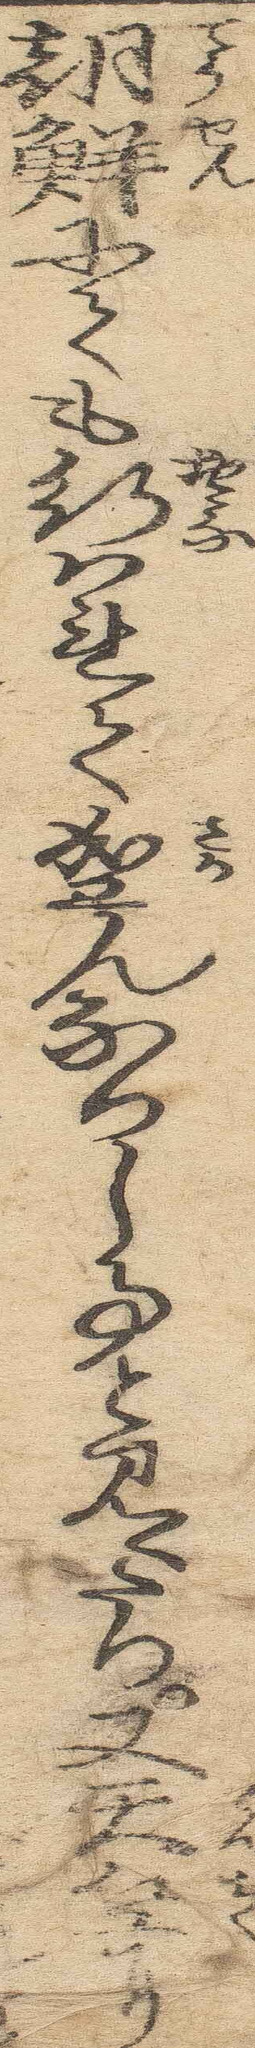朝鮮にても行はれて盛んなりし事と見へたり。又天竺に
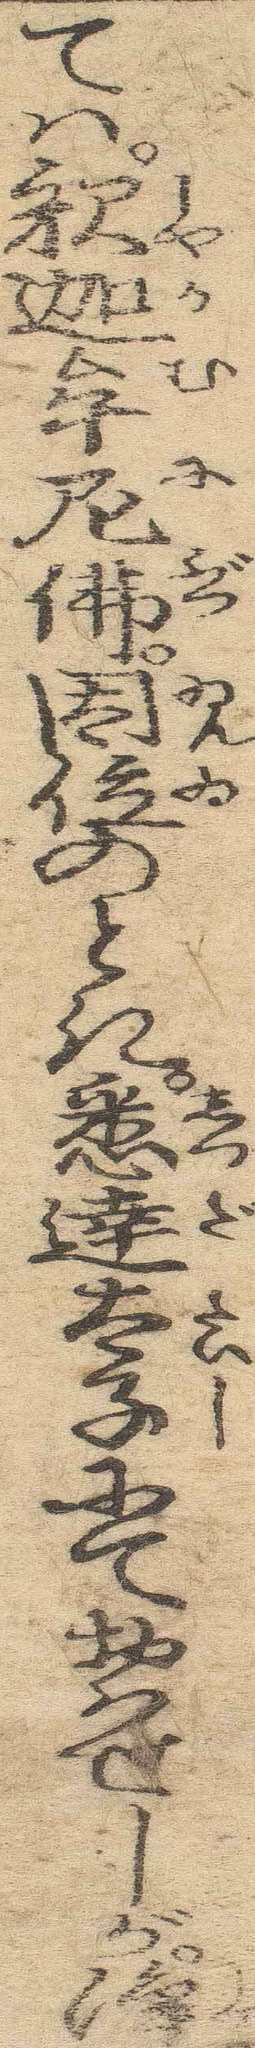ては。釈迦牟尼仏。因位のとき。悉達太子にておはせしが。浄飯王
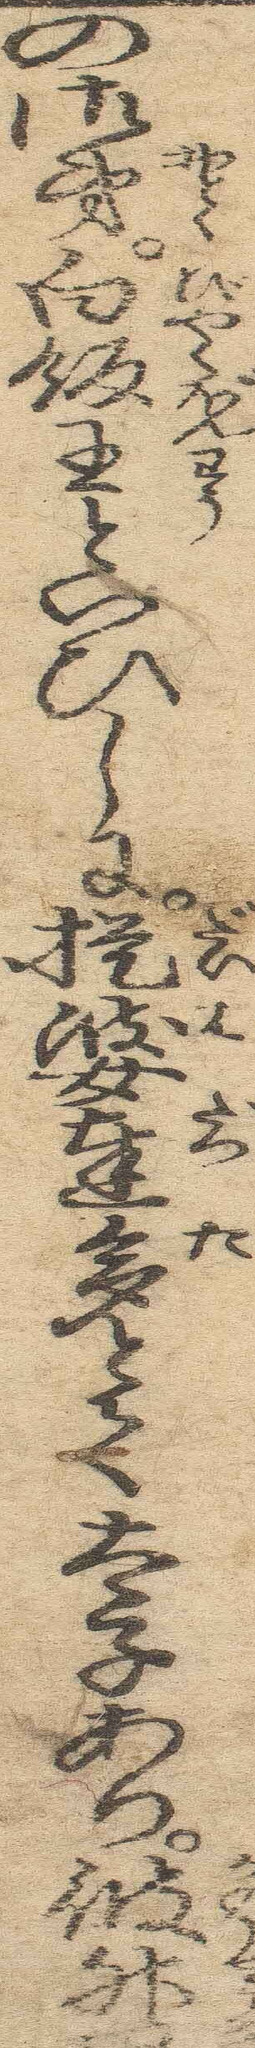の御弟。白飯王といひしに。提婆達多とて太子あり。彼升男伴
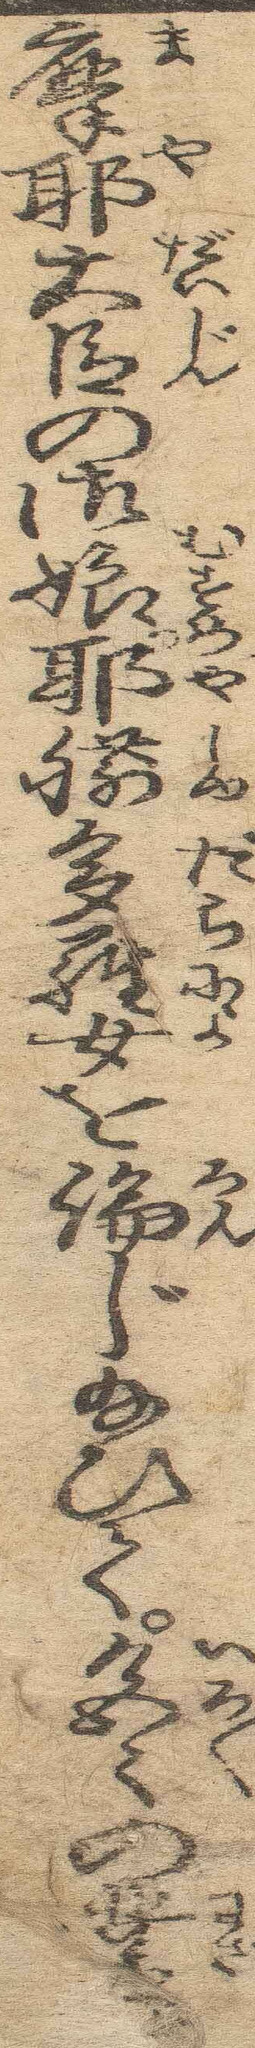摩耶大臣の御娘耶輸多羅女を論じ給ひて。色々の業をなし
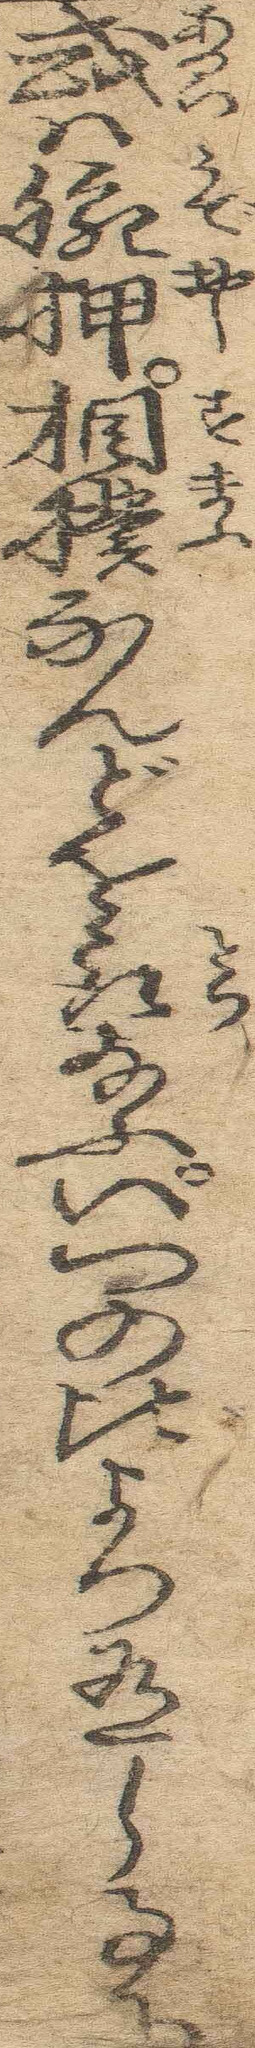或は腕押。相撲なんどを取給ふ。いつの比より有し事にや。法華

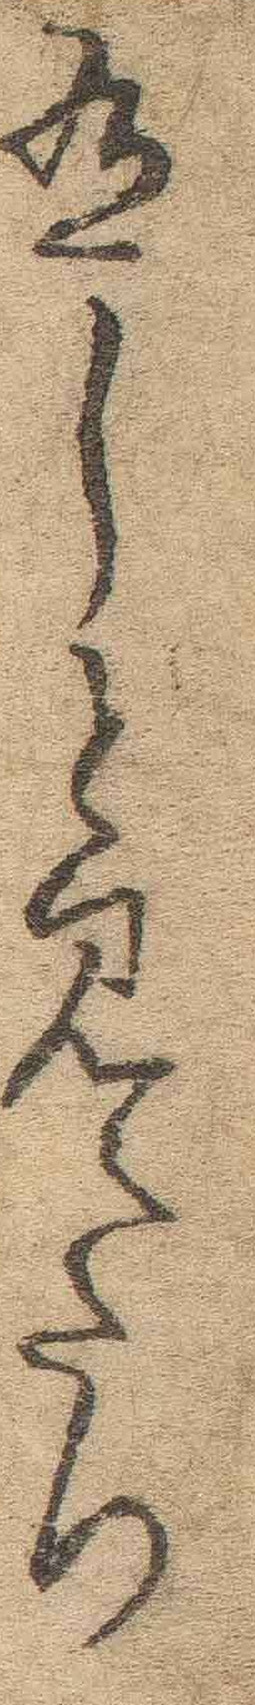有しと見へたり
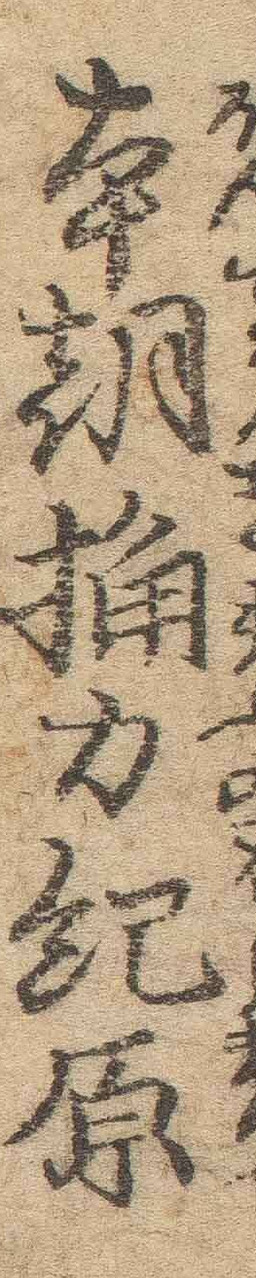本朝捔力紀原
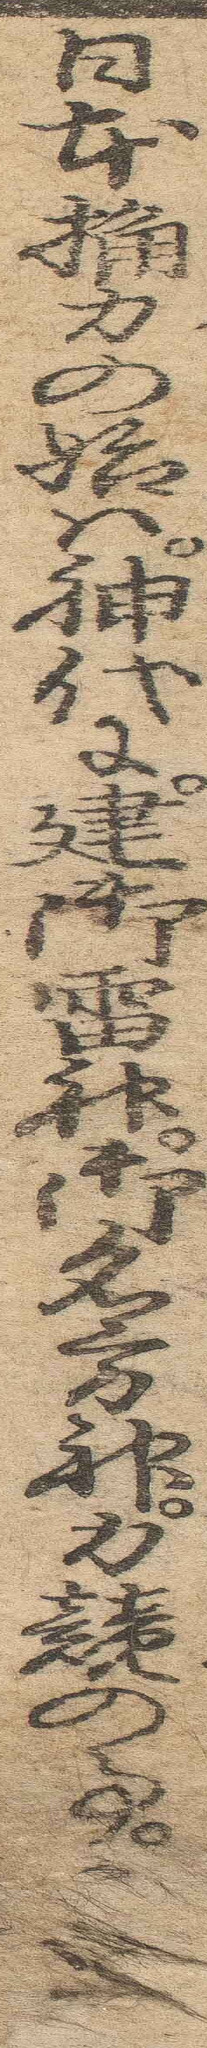日本捔力の始は。神代に。建御雷神。御名方神。力競の事。旧事
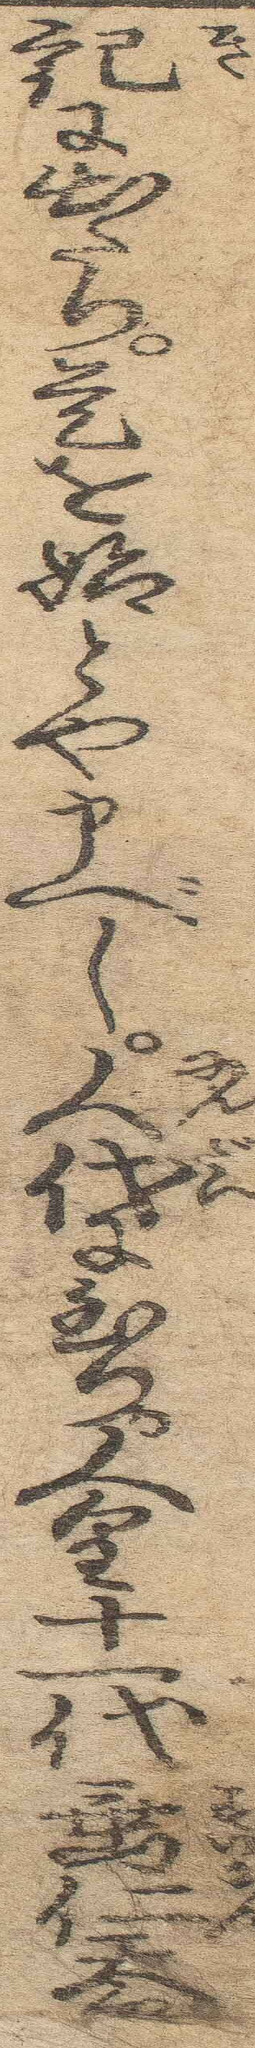紀に出たり。是を始とや申べし。人代に至り。人皇十一代垂仁天皇
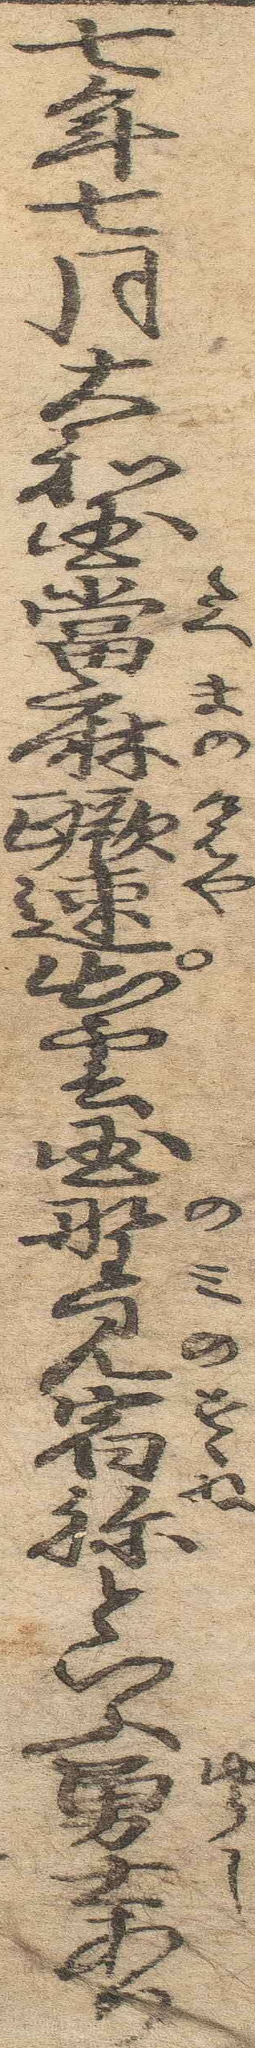七年七月大和国当麻蹶速。出雲国野見宿祢といふ勇士あり
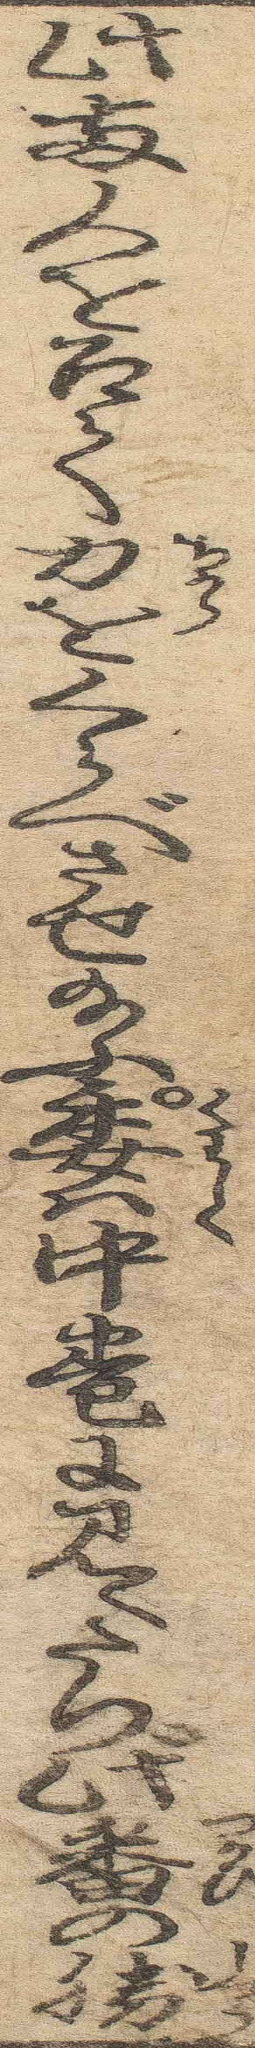此両人を召て力をくらべさせ給ふ。委は中巻に見へたり。此番の勝
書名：古今相撲大全
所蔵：東京学芸大学附属図書館 国文学研究資料館
